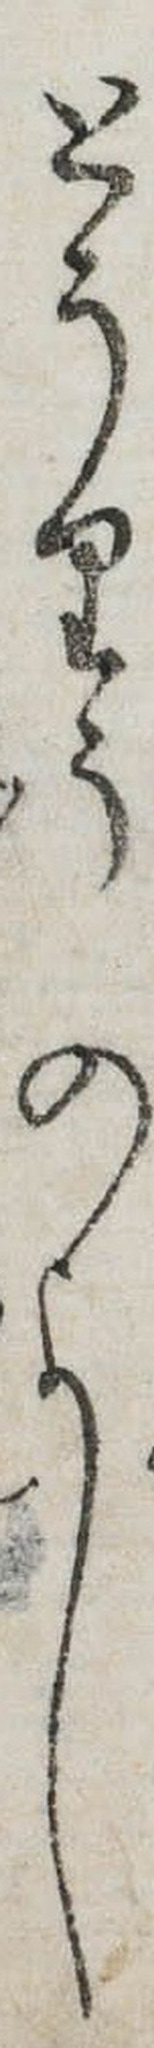とうりうのよし
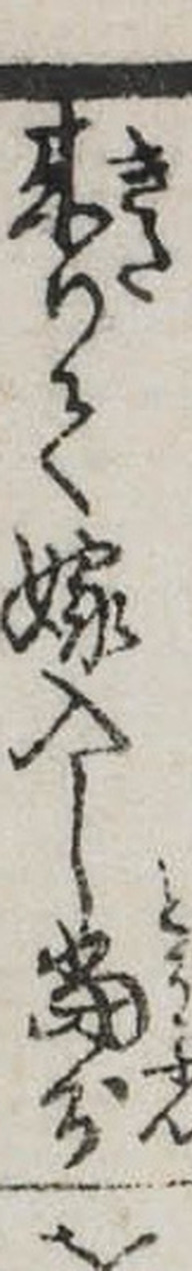来りて嫁入し当分
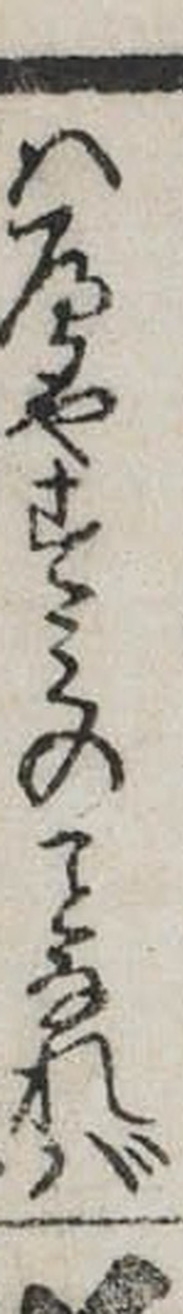はへやすみのことなれば
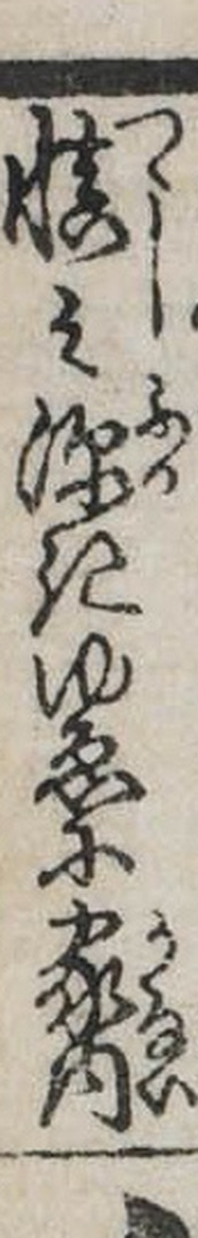慎み深きゆゑに家内
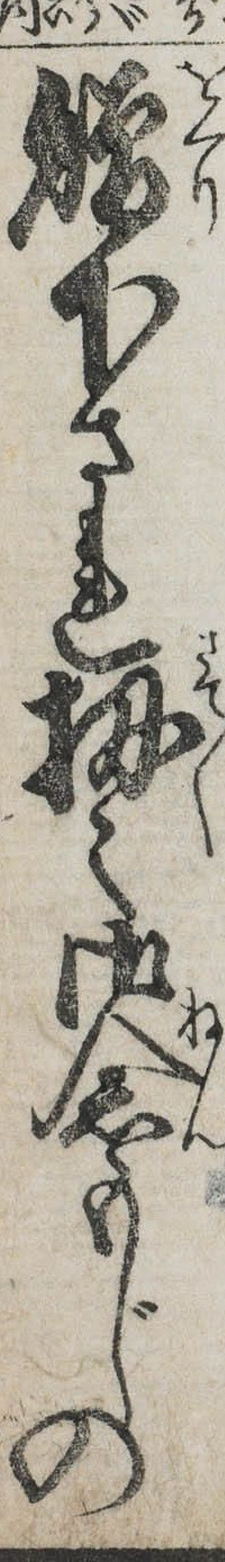贈下され扨々御念もじの

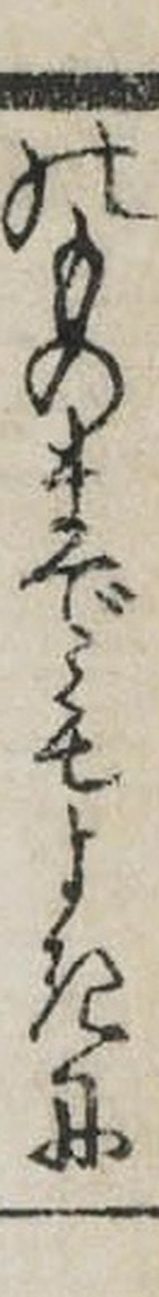のものまでもよきに
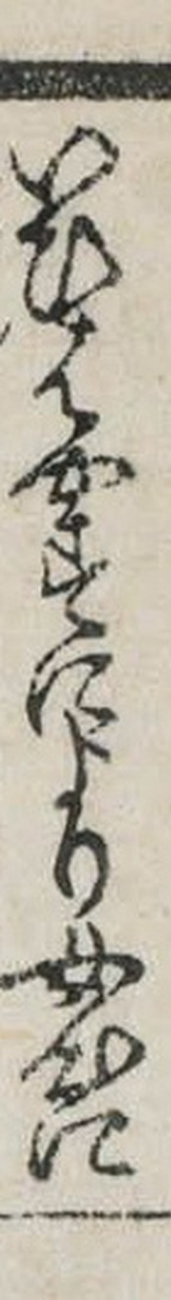いひはやすにより女心に
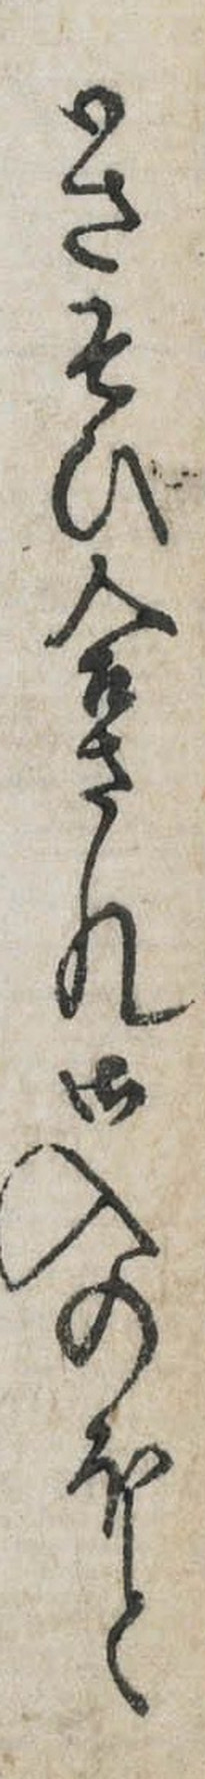御さそひ合され御入のほと
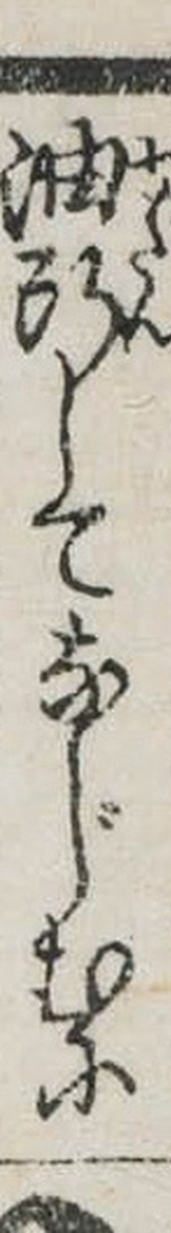油断してなじむに
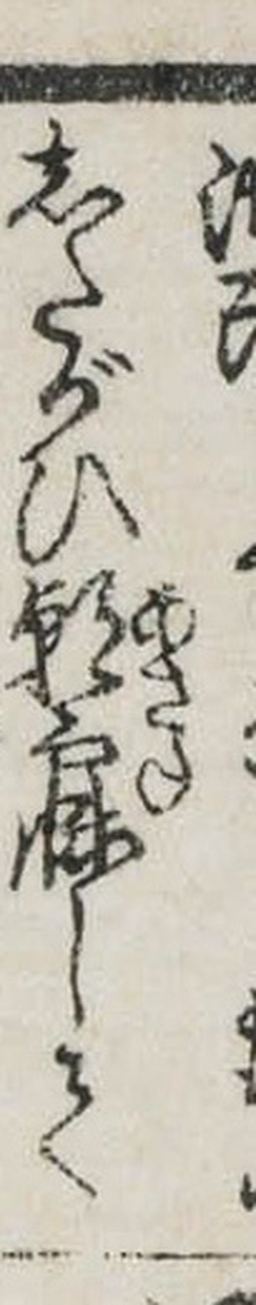したがひ朝寝して
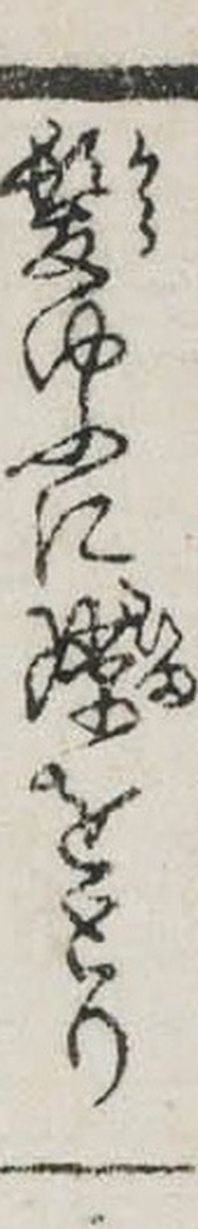髪ゆふに隙をとり
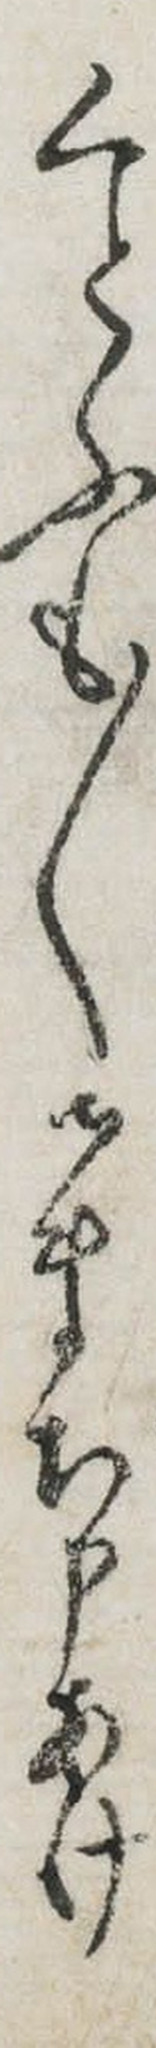くとふも〳〵御まち申あけ
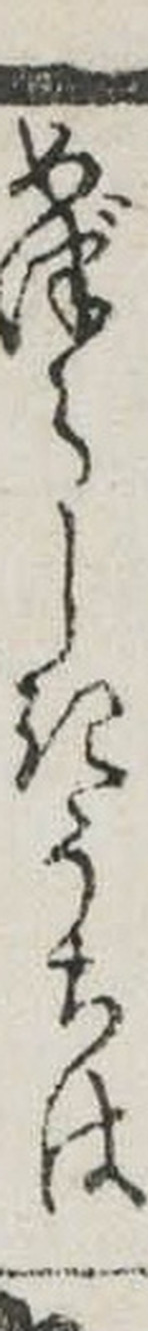めづらしきうちは
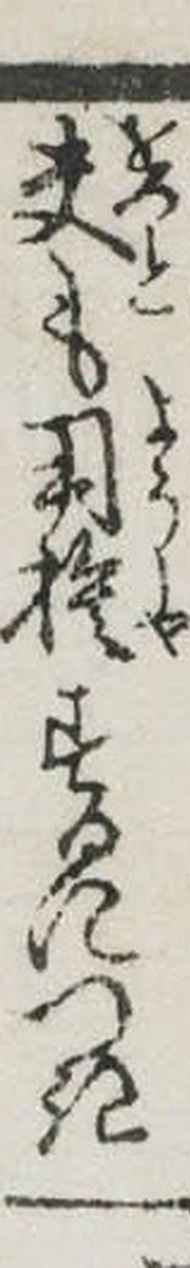夫も用捨するにつき
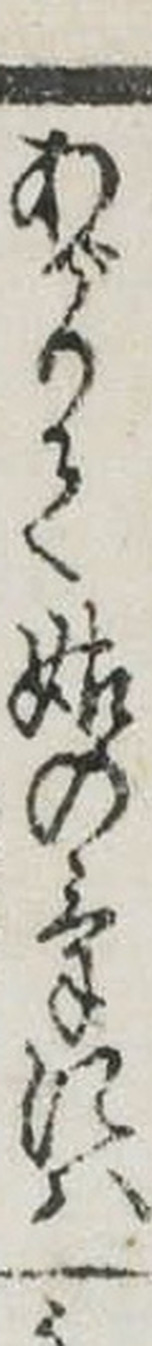あがりて姑の気には
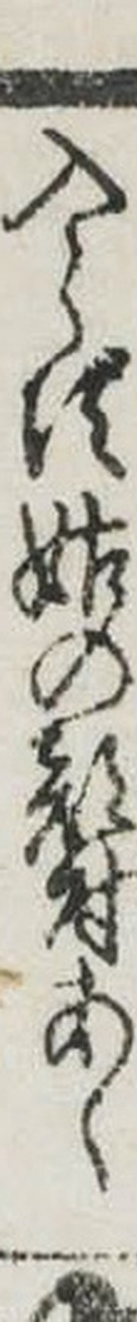入らず姑の顔付あし
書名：頭書萬用婦人手紙之文言
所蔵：東京学芸大学教育コンテンツアーカイブ
